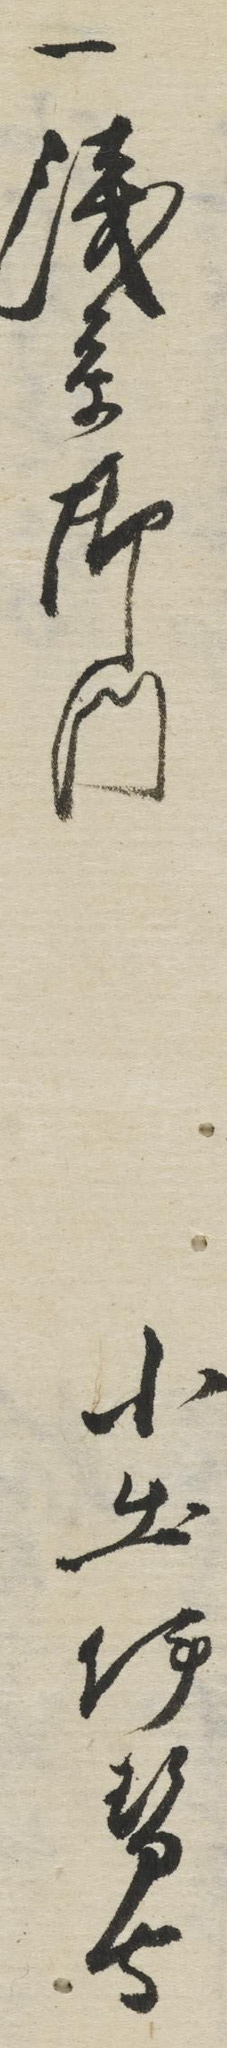一浅草御門小出伊勢守
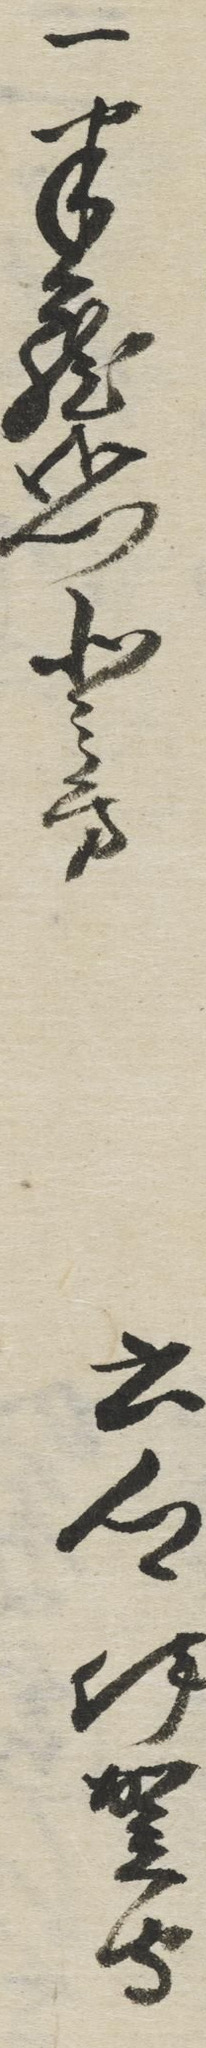一半蔵御門北之方六郷伊賀守
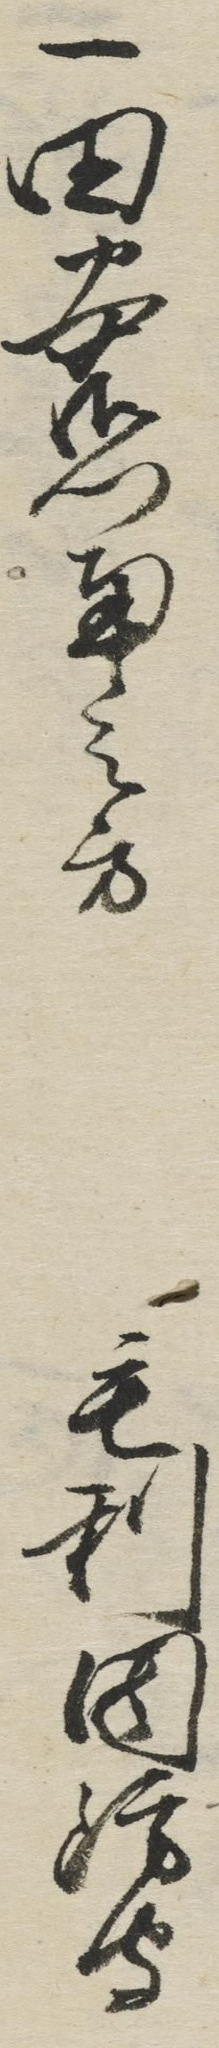一田安御門南之方毛利周防守
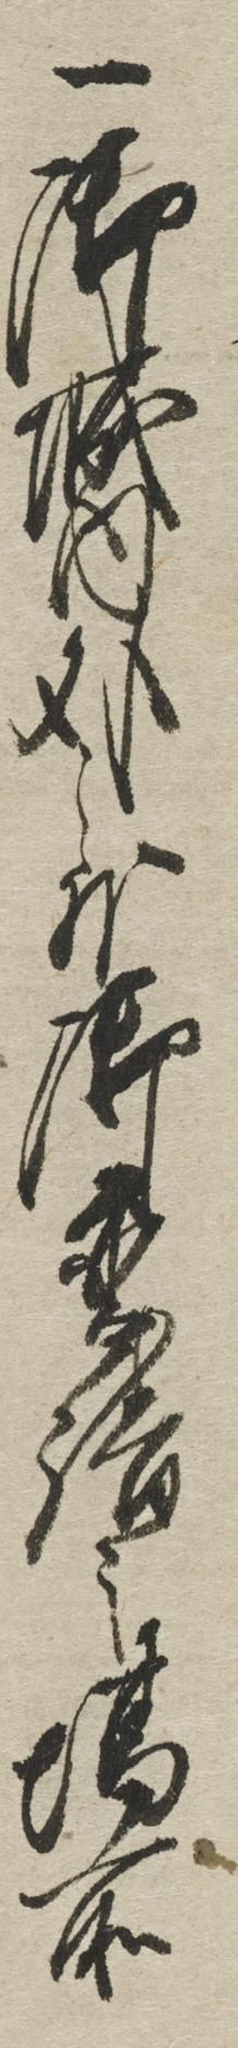一御城内外外御普請之場所
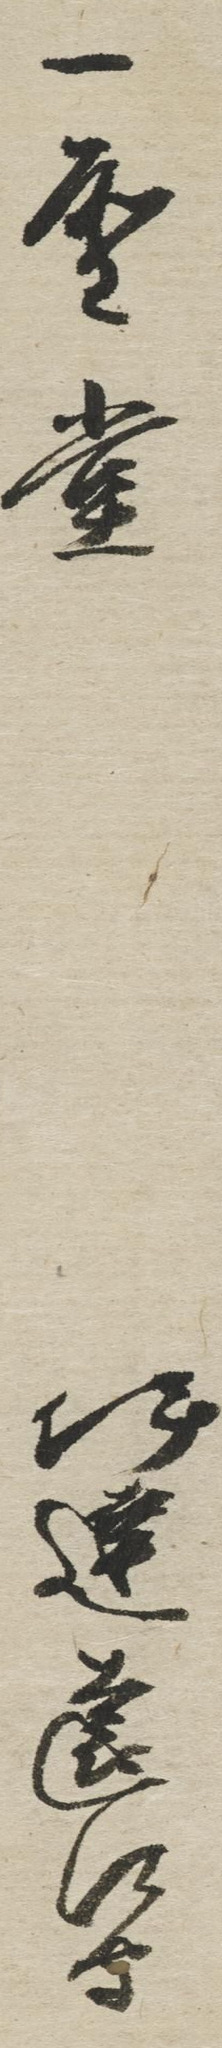一望堂伊達遠江守
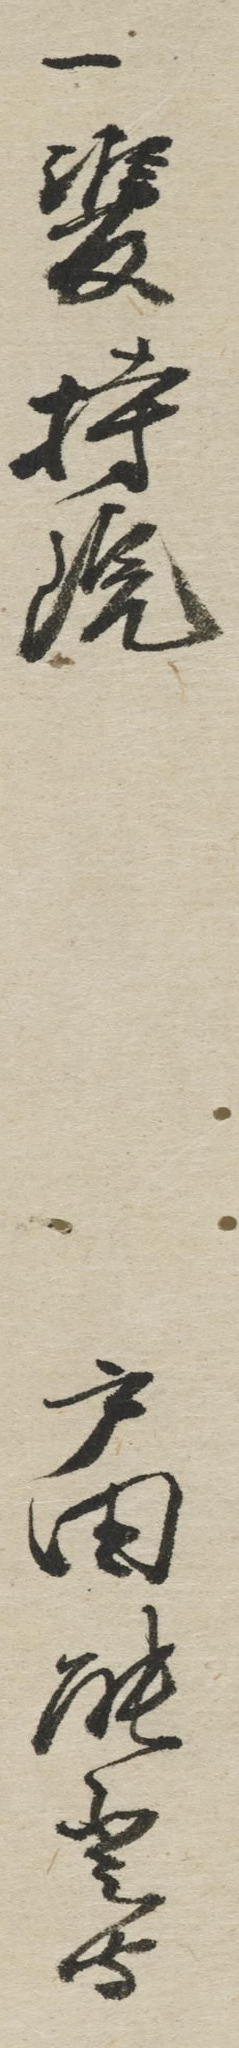一斐持院戸田能登守
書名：元禄地震記
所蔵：東京大学地震研究所図書室 Earthquake Research Institute Library, The University of Tokyo, JAPAN
